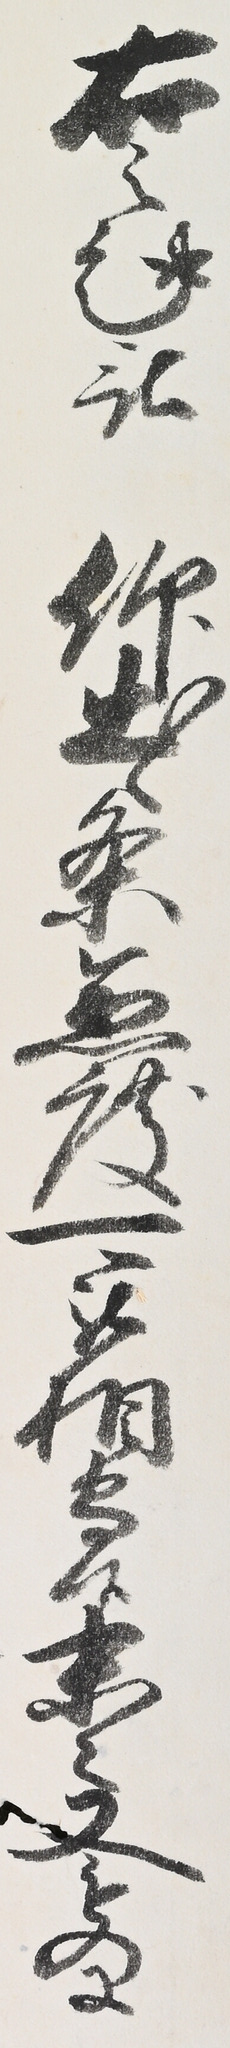右之趣被仰出候条急度可被相守候末々又ものに
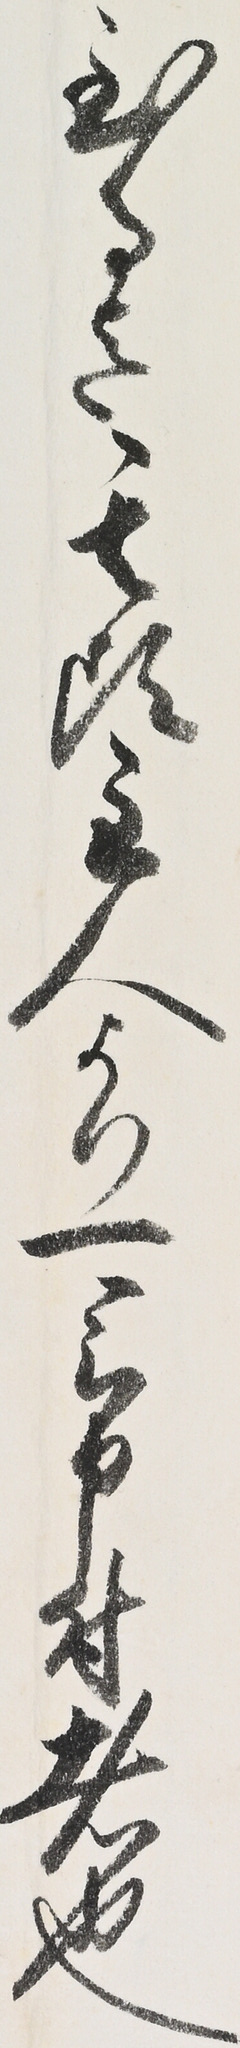至る迄其頭主人より可被申付者也
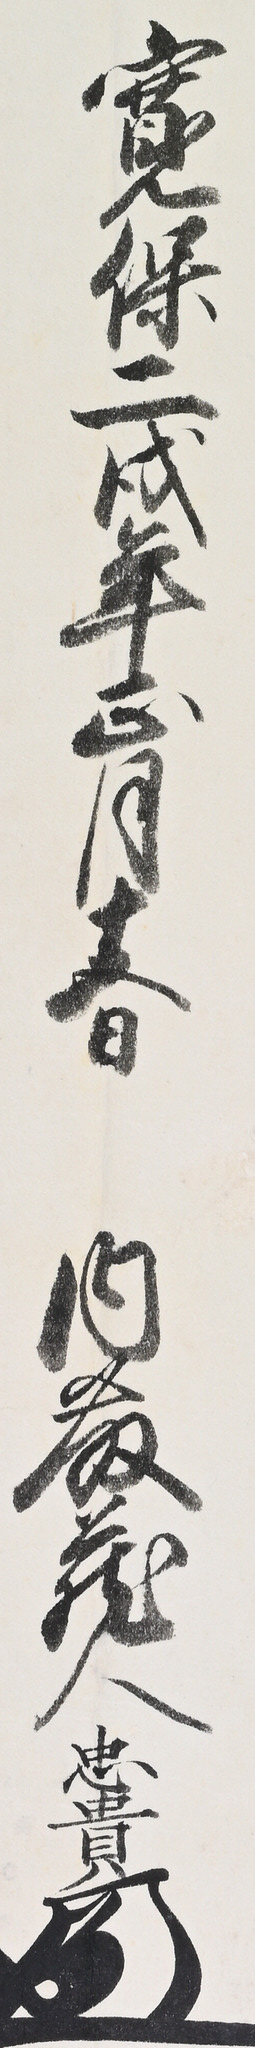寛保二戌年正月十五日内藤蔵人忠貴花押

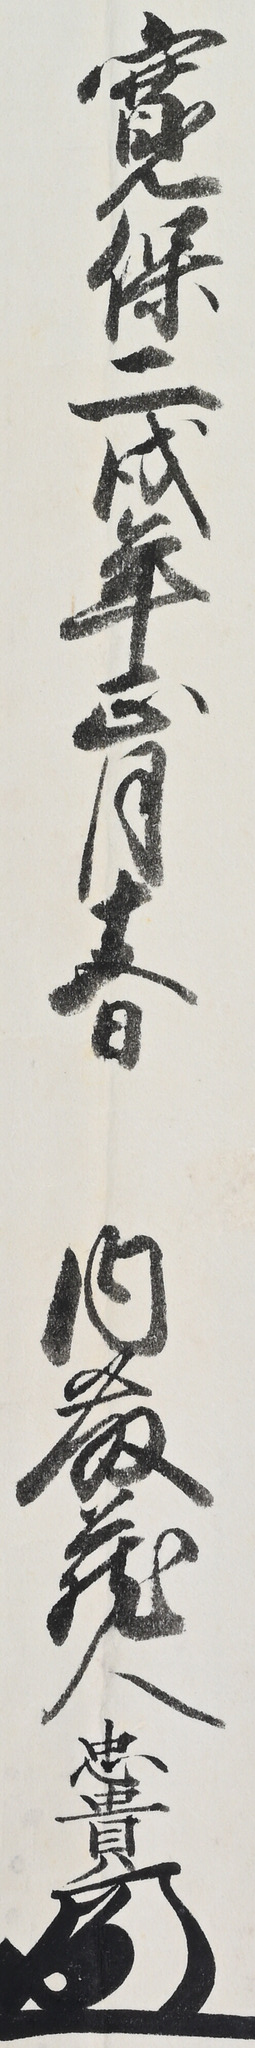寛保二戌年正月十五日内藤蔵人忠貴花押

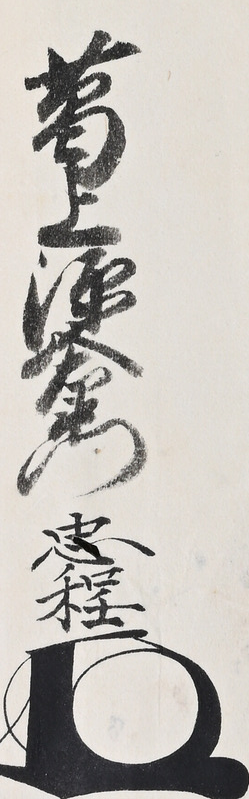葛上源五右衛門忠程花押
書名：仰書覚〔写共二通一括〕
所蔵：伊那市立高遠町図書館・合同会社AMANE
